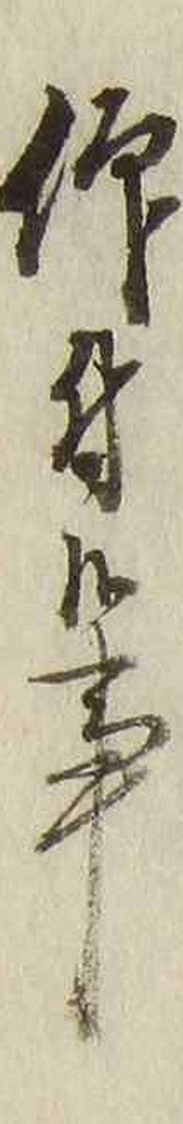仰付候事

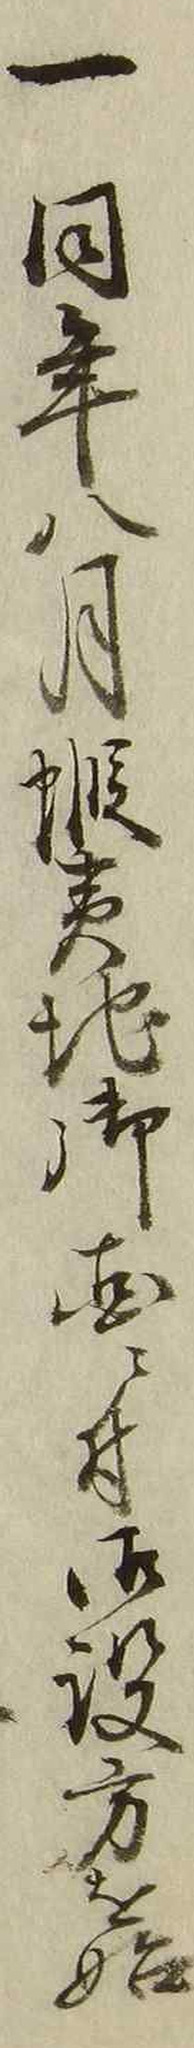一同年八月蝦夷地御固ニ付御設方を始
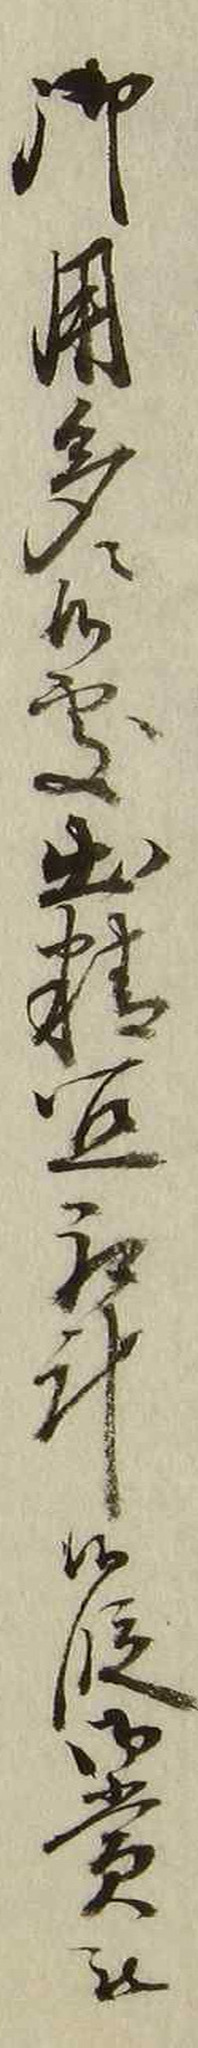御用多ニ候処出精宜取計候段御賞被
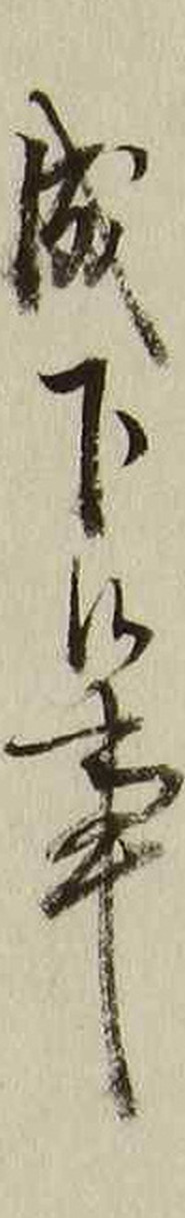成下候御
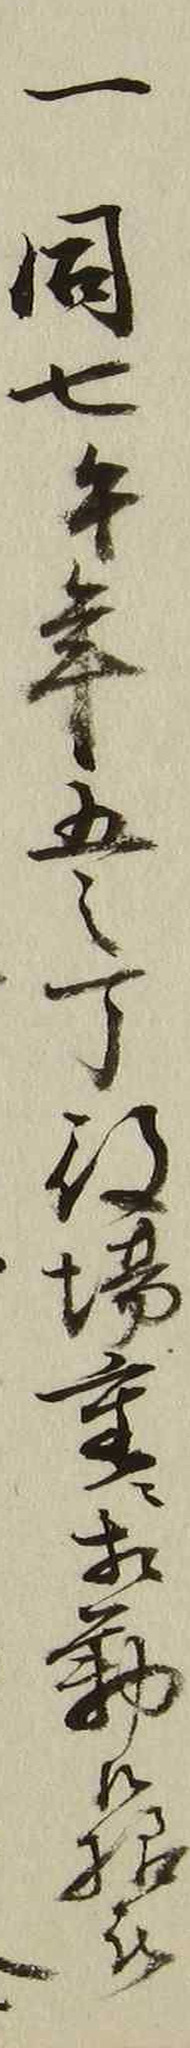一同七午年五之丁役場重ニ相勤候様被
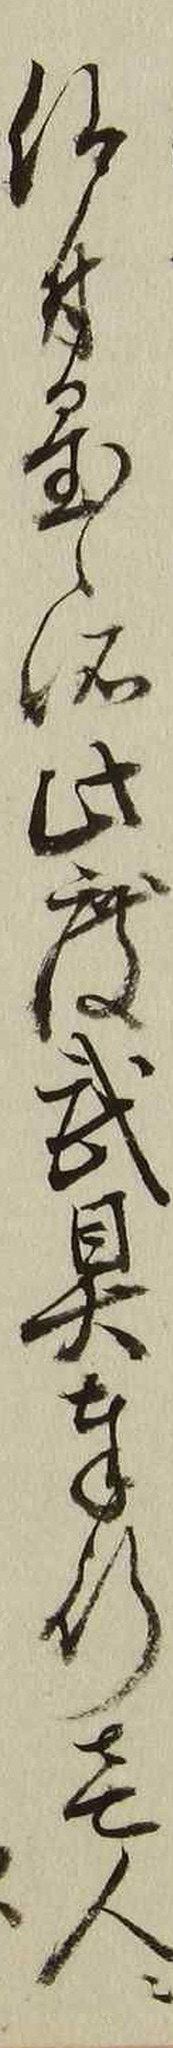仰付置候所此度武具奉行壱人ニ
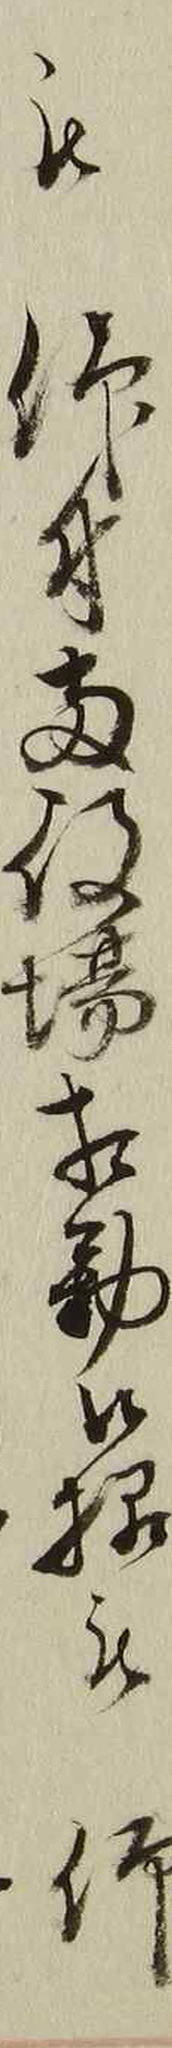被仰付両役場相勤候様被仰
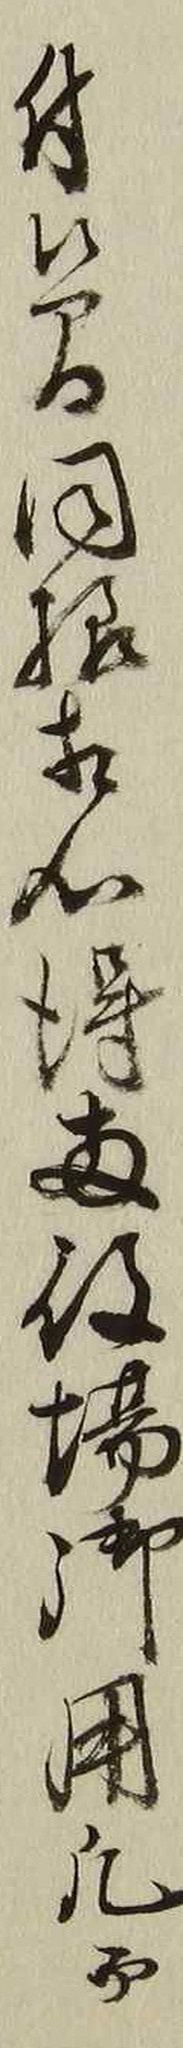付候間同様相心得両役場御用凡而
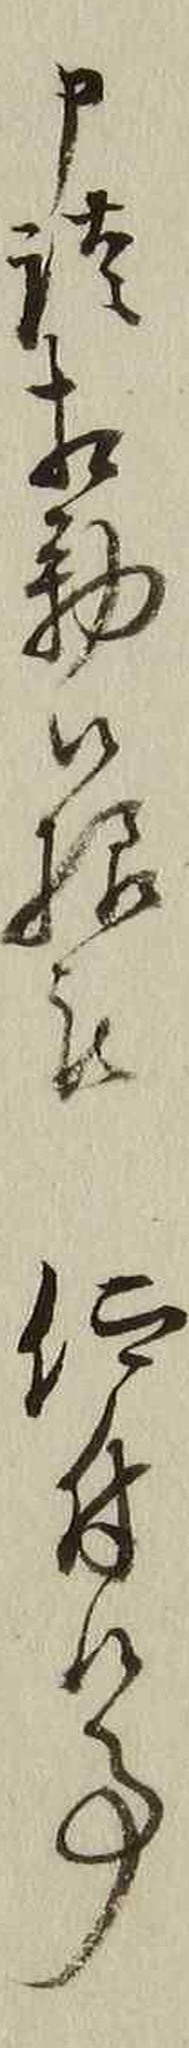申談相勤候様被仰付候事
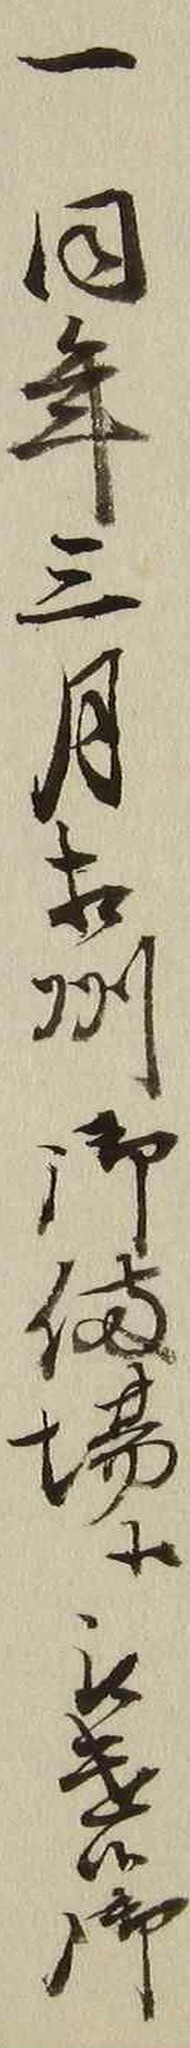一同年三月相州御備場江被遣候御
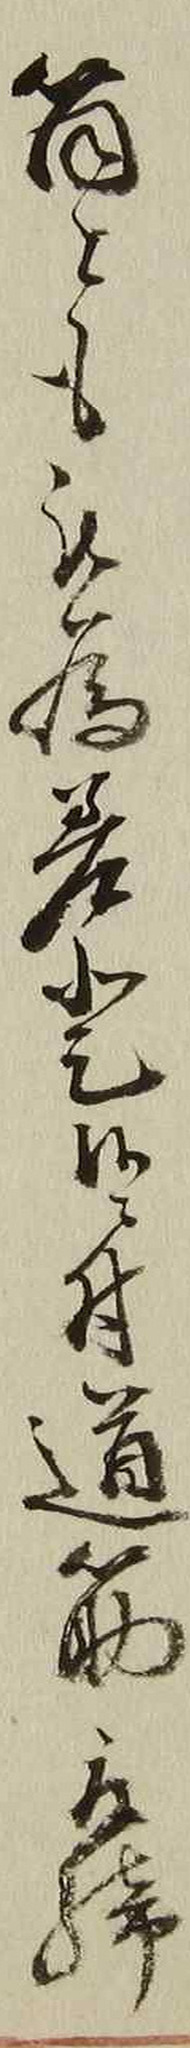筒とも被為差登候ニ付道筋取締
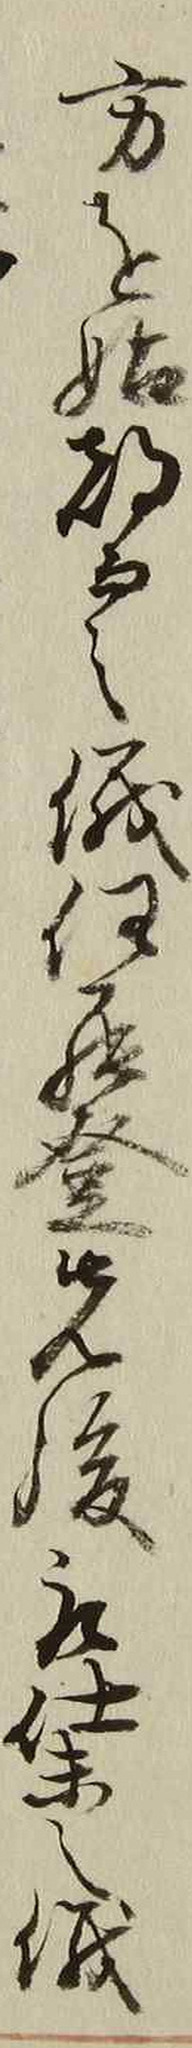方を始都而之儀任罷登先後取仕末之儀
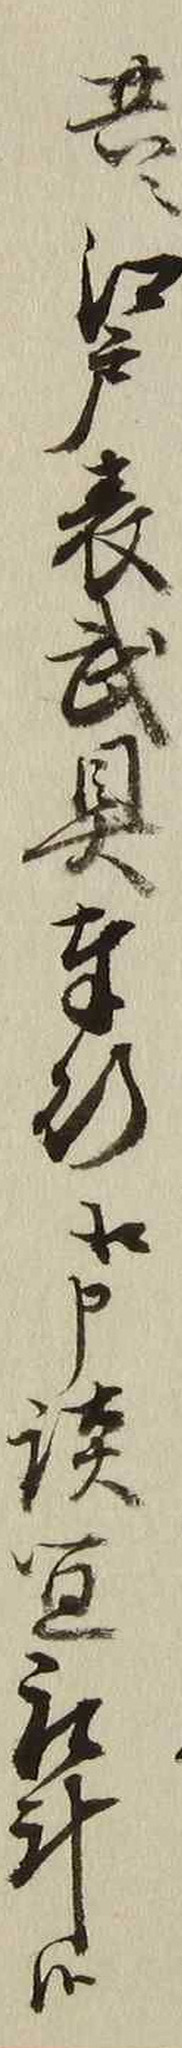共ニ江戸表武具奉行江申談宜取計候
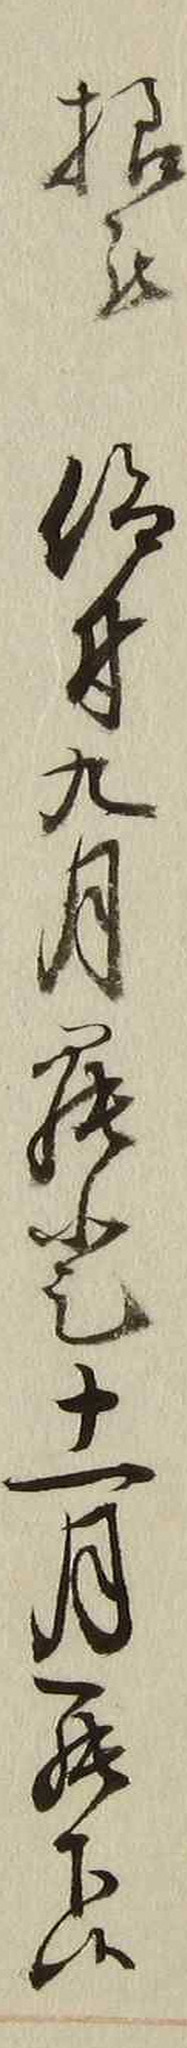様被仰付九月罷登十一月罷下候
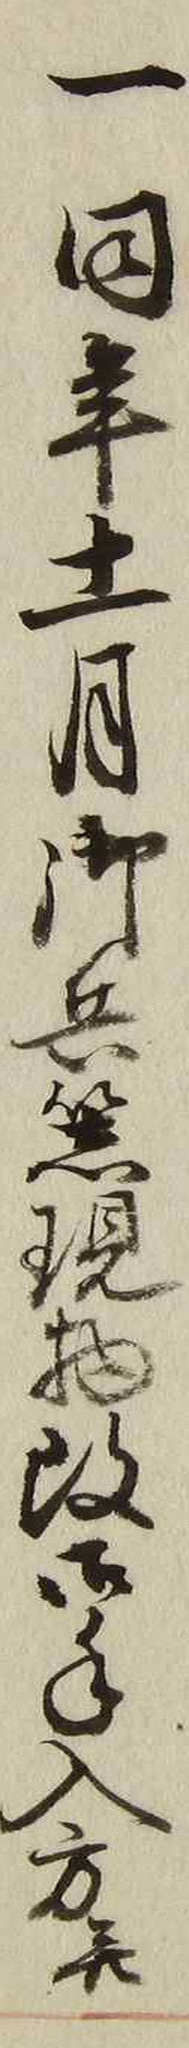一同年十一月御兵器現物改御手入方并
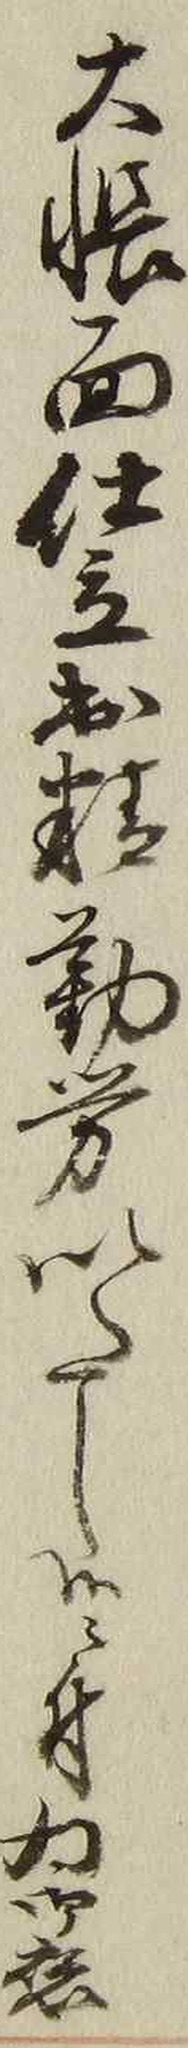大帳面仕出精勤労いたし候ニ付為御褒
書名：諸士系譜　巻之36　は之部4
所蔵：会津若松市立会津図書館
